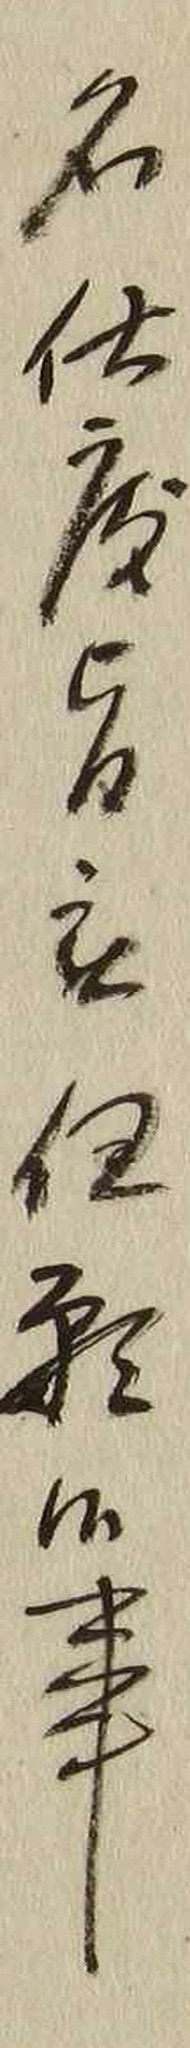名仕度旨被任願候事
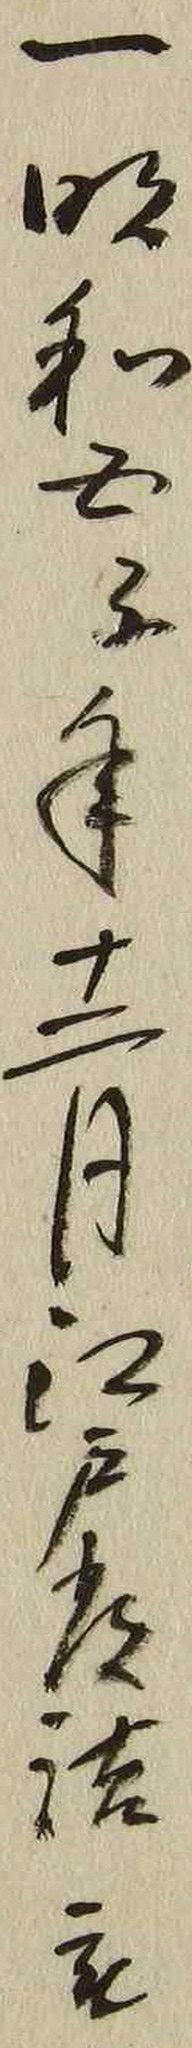一明和五子年十二月江戸常詰被
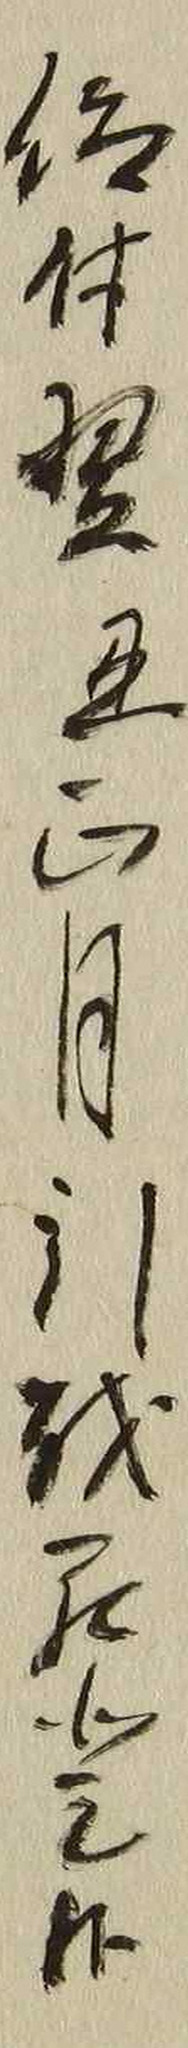仰付翌丑正月引越罷登候
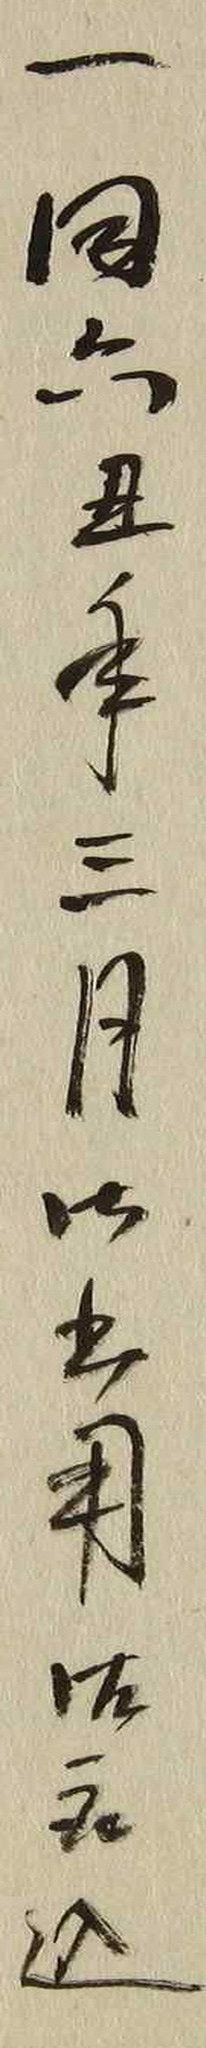一同六丑年三月御書用御取込
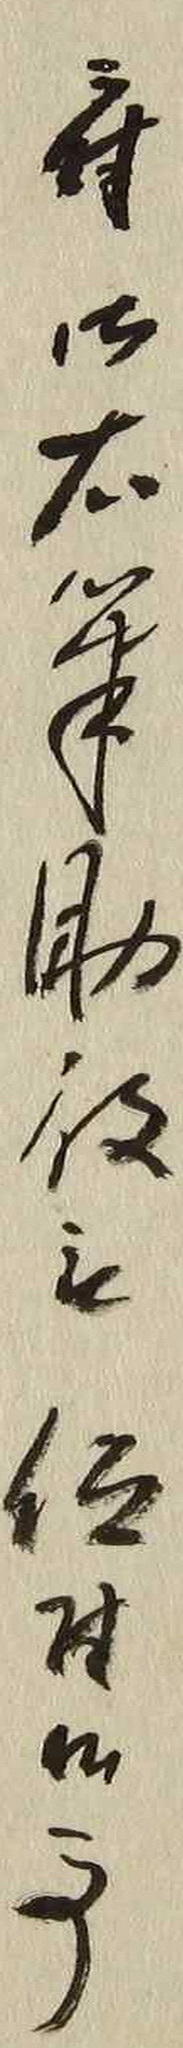ニ付御右筆助役被仰付候事
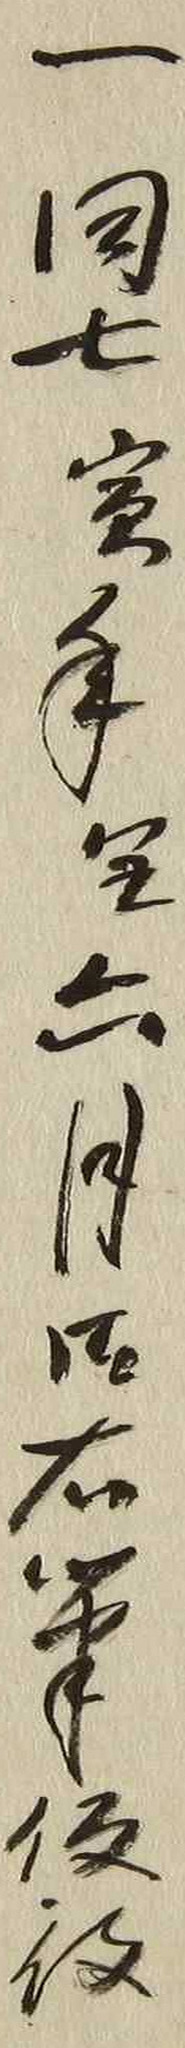一同七寅年閏六月御右筆仮役
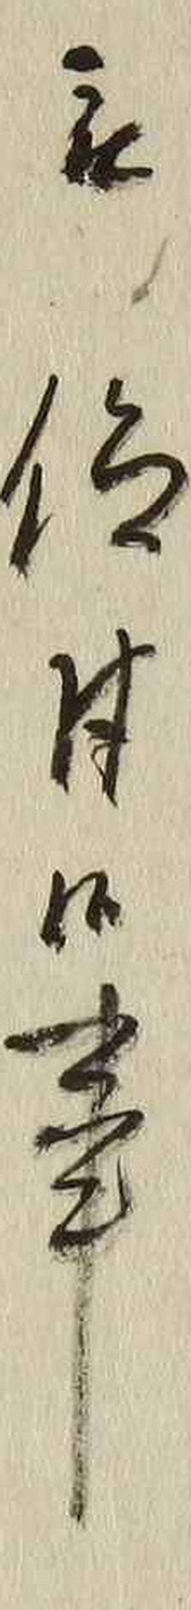被仰付候事
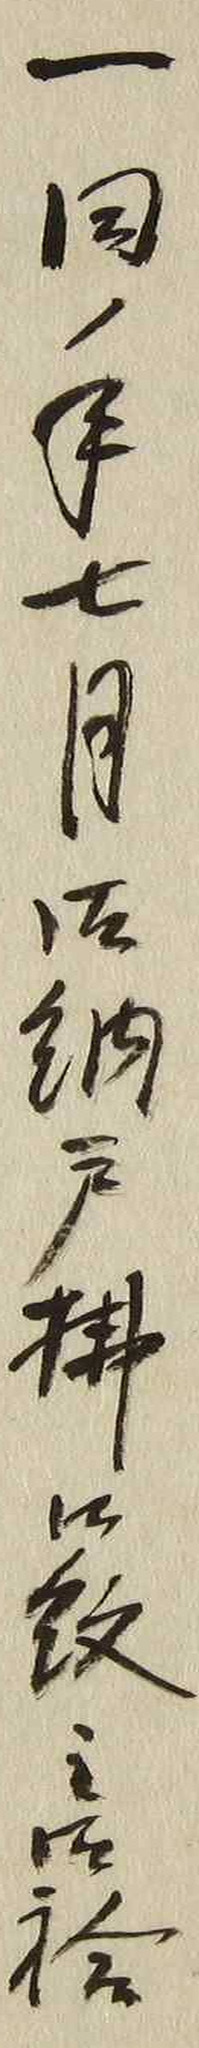一同ノ年七月御納戸払御紋之御袷
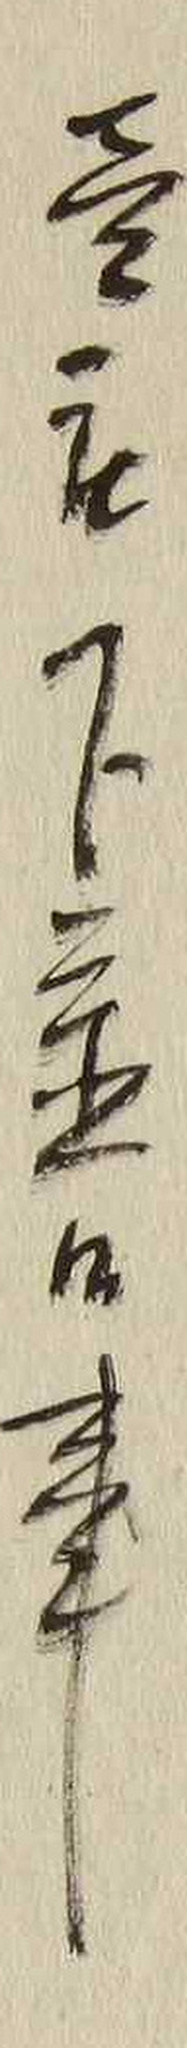壱被下置候事
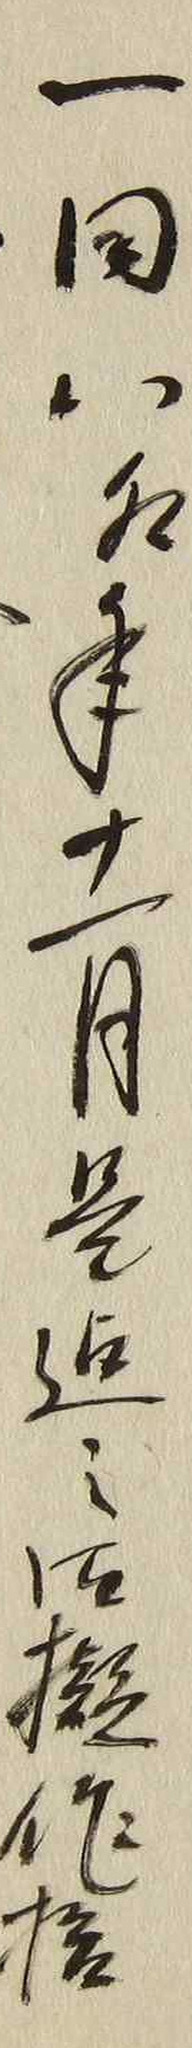一同八卯年十一月是迄之御擬作拾
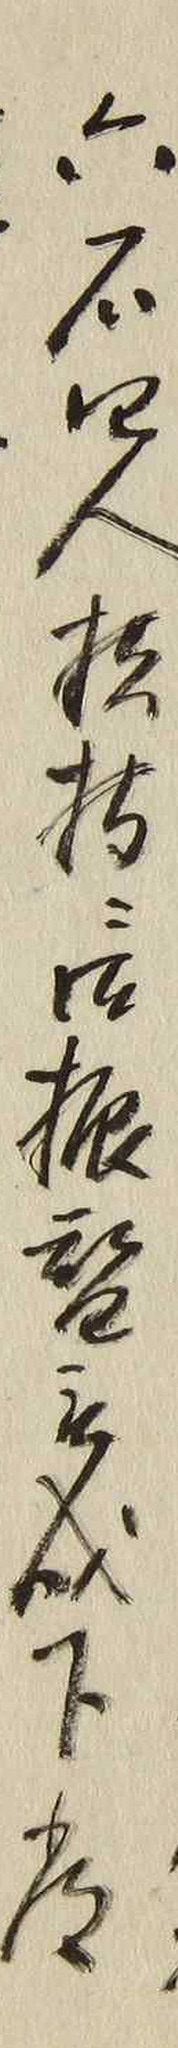六石四人扶持ニ御振替被成下常
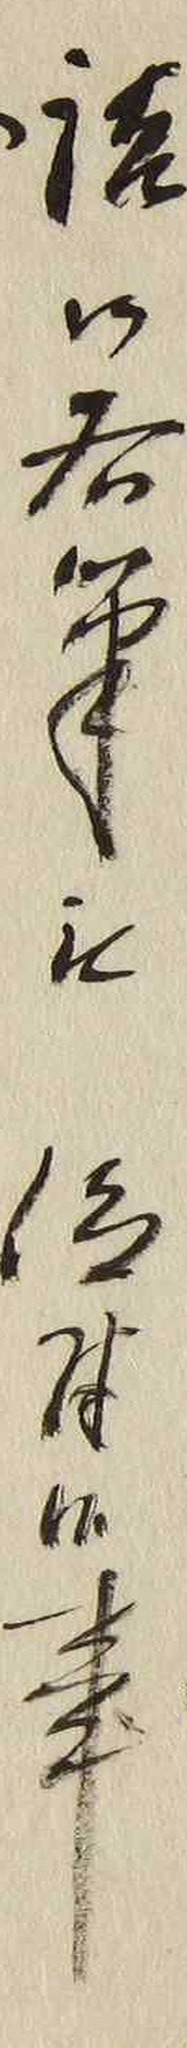詰御右筆被仰付候事
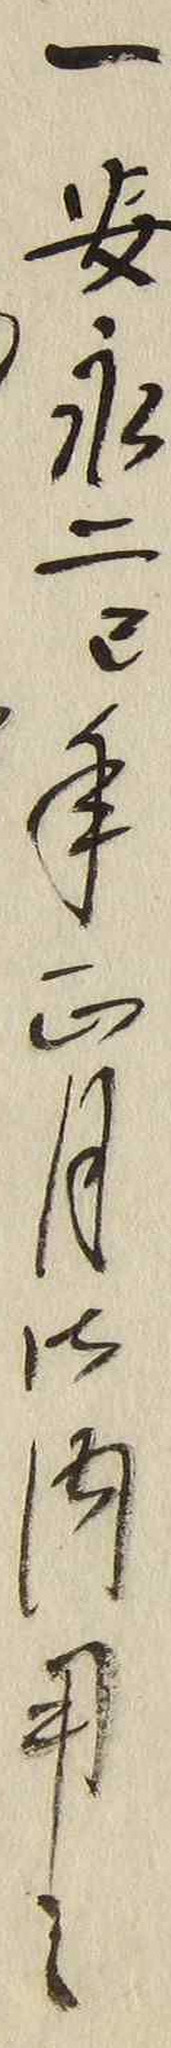一安水二巳年正月御内用之
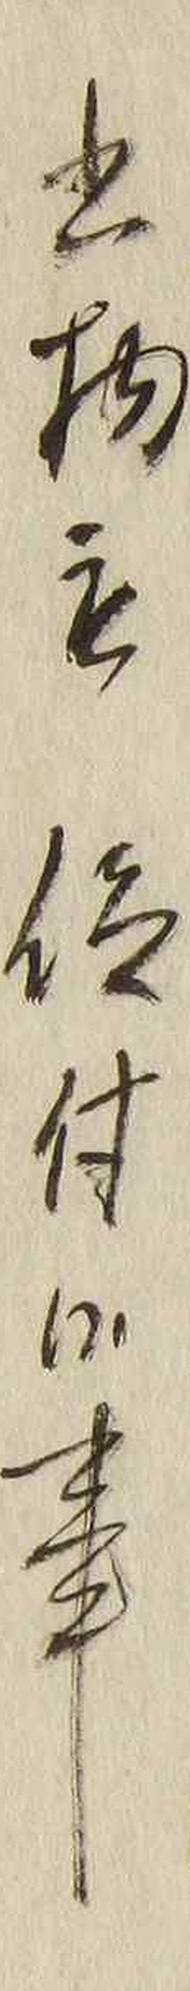書物被仰付候事

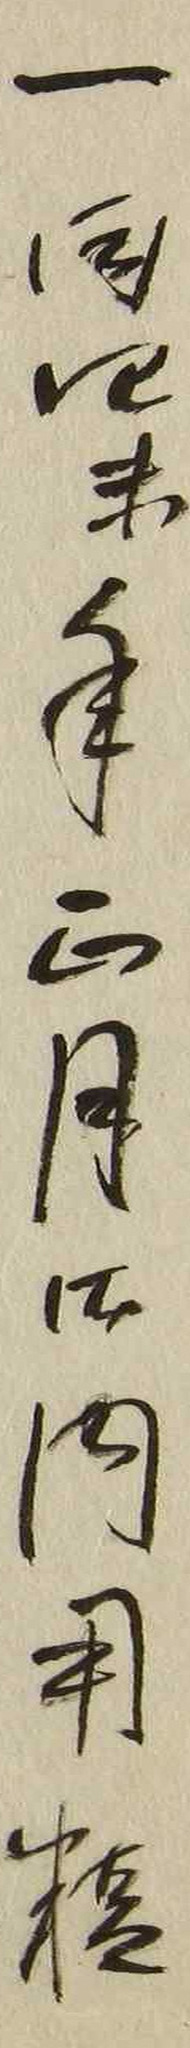一同四未年正月御内用精
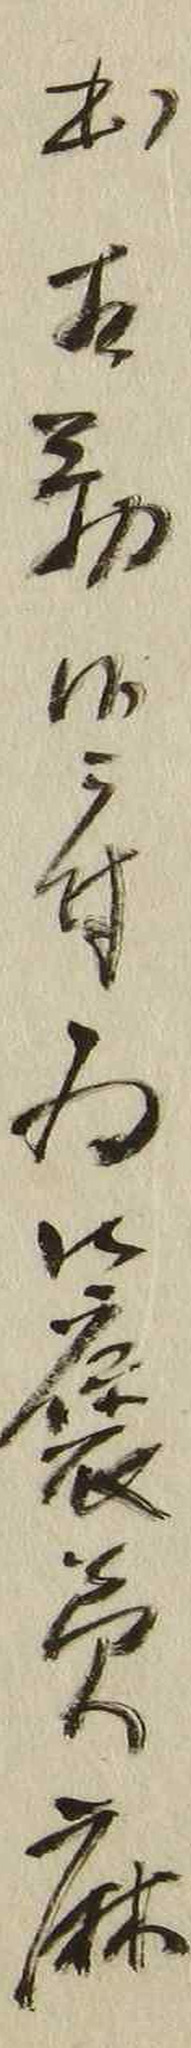出相勤候ニ付為御褒美麻
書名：諸士系譜　巻之359　す之部9
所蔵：会津若松市立会津図書館
